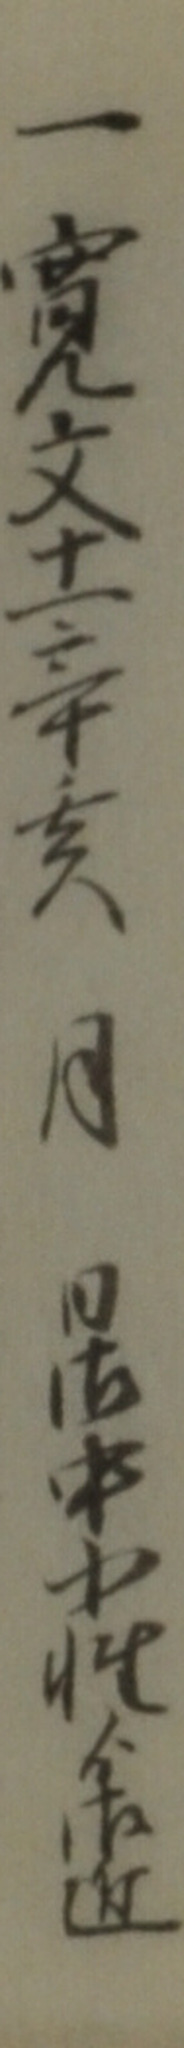一寛文十一辛亥月日御中小性ゟ御近
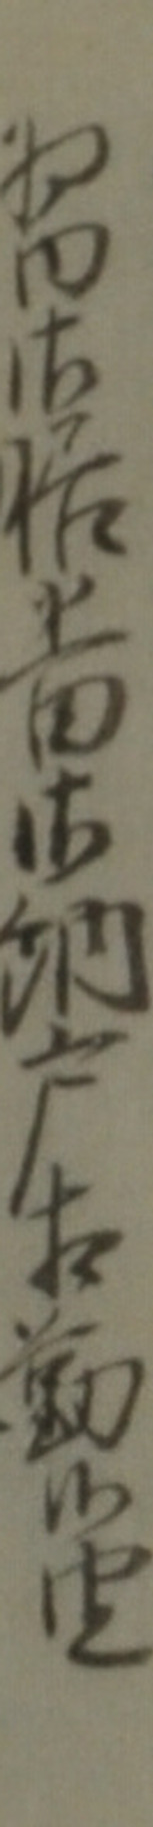習御膳番御納戸相勤候由
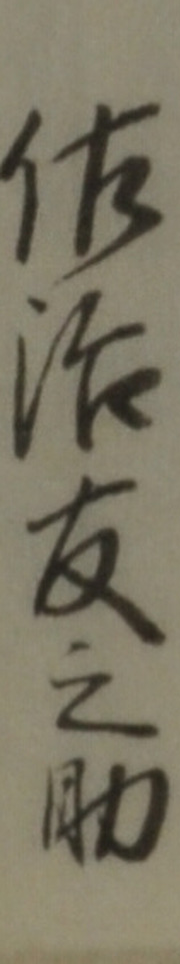佐治友之助
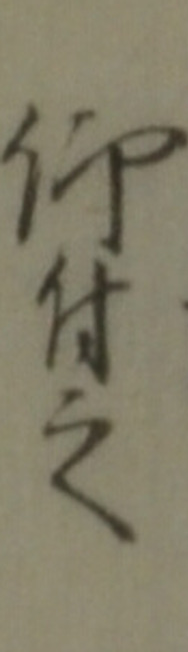仰付之
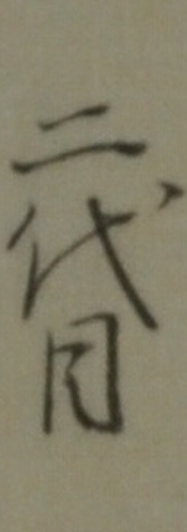二代目
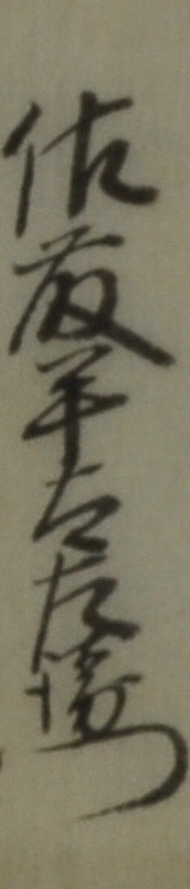佐藤半太左衛門
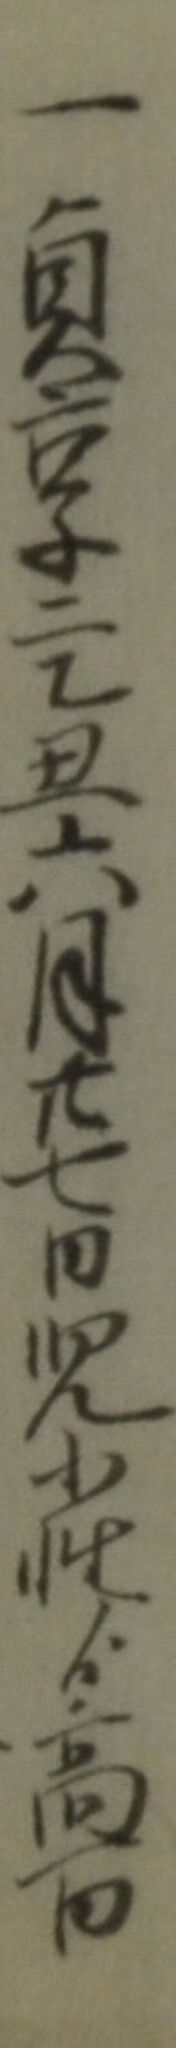一貞享二乙丑六月廿七日児小性ゟ高百
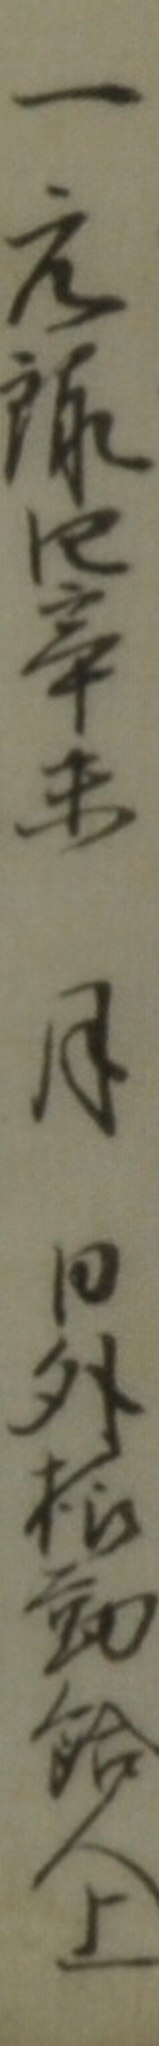一元禄四辛未月日外様勤給人上
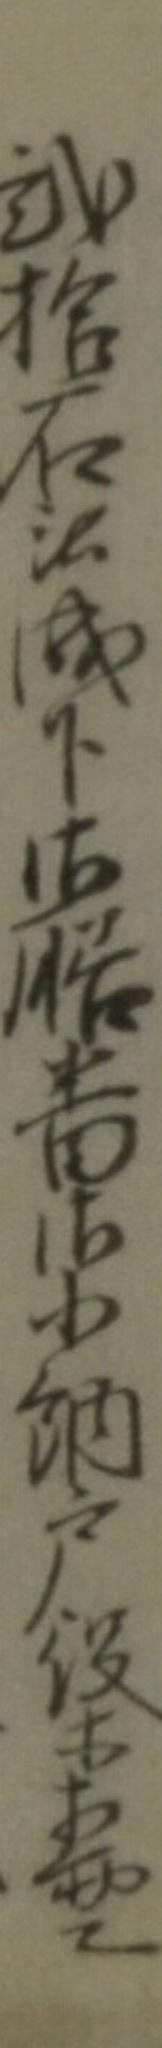弐拾石被成下御膳番御小納戸役等相勤之
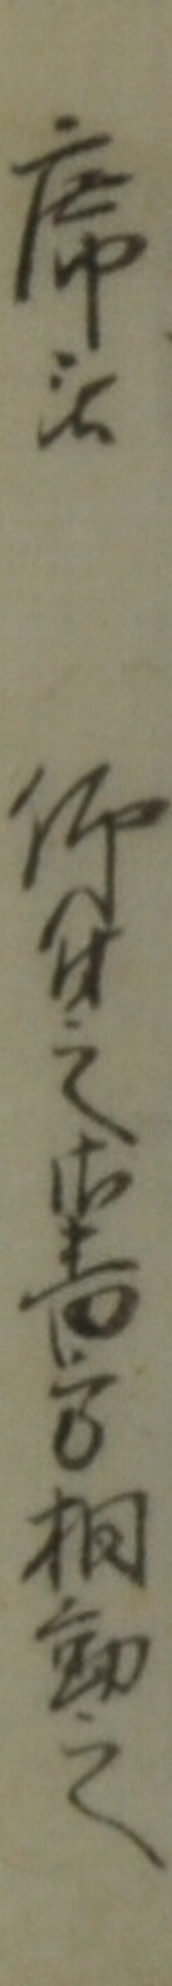席被仰付之御番方相勤之

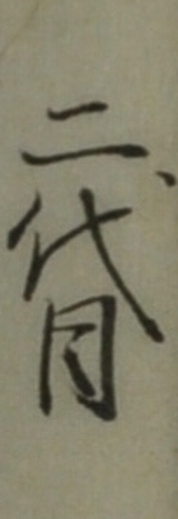二代目
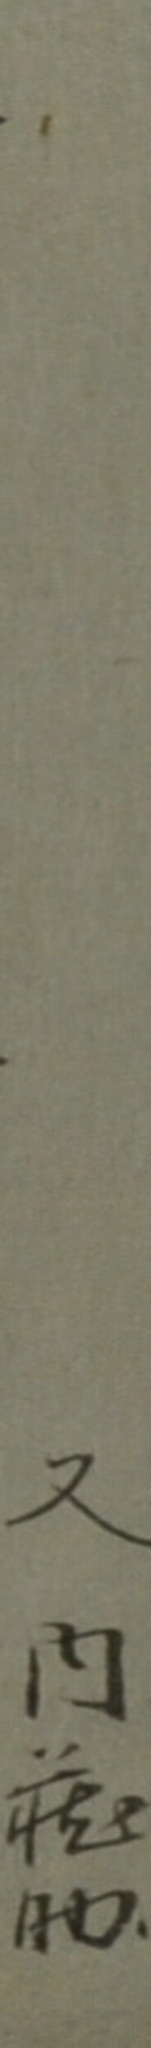又内蔵助
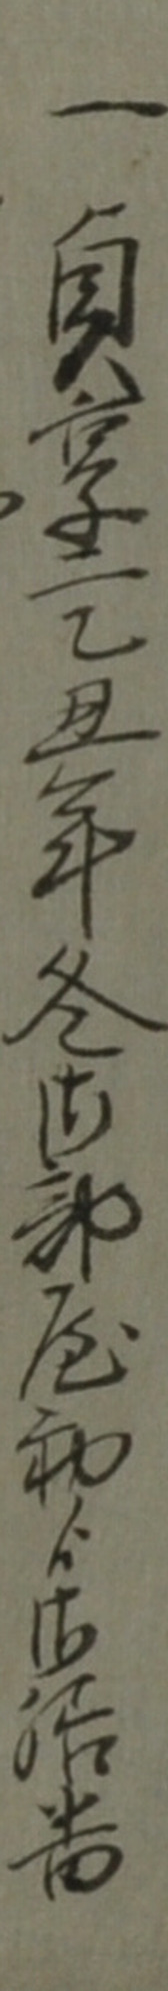一貞享二乙丑年冬御部屋勤ゟ御膳番
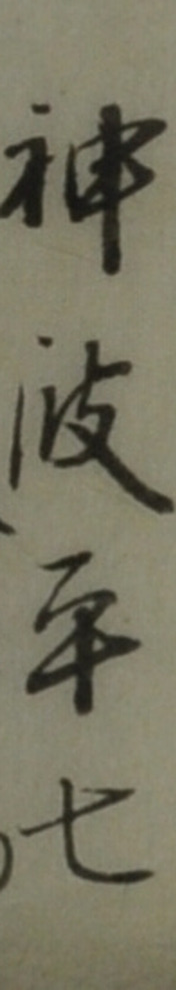神波平七
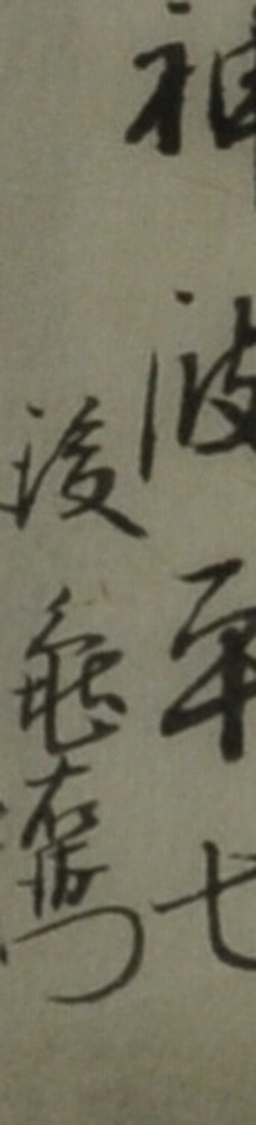後亀右衛門
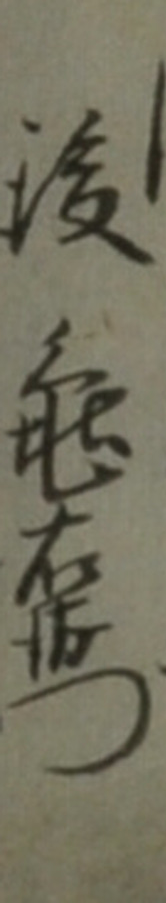後亀右衛門
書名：諸御役代々録（四）
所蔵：伊那市立高遠町図書館・合同会社AMANE
